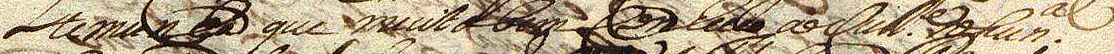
temunha que muito bem conheceo ao Cust.e o seu n.al
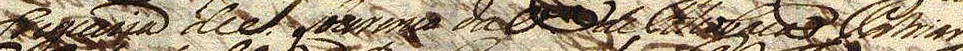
freguesia de S. Lourenço da V de Alcobaca Patriar
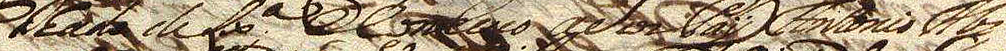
chado de Lx.a e conheceo a seos Pais Antonio Alz̄
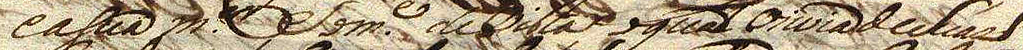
e a sua m.er Som.e de vista, o qual vivia de Suas
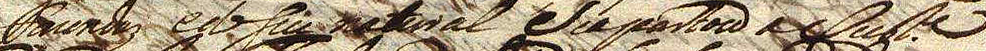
fazendas e do seu natural Se apartou o Iust.e
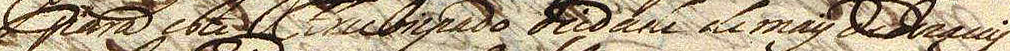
para este Arcebispado de idade de mais de dezaceis
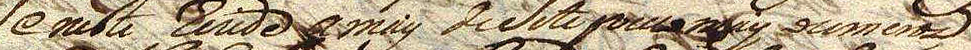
e neste Rezide a mais de Sete pouco mais, ou menoz
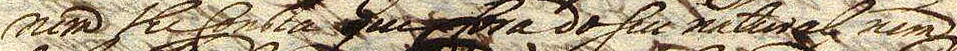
nem lhe Consta que fora do seu natural, nem
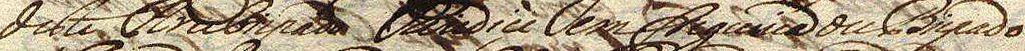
deste Arcebispado Rezidiçe em freguesia ou Bispado
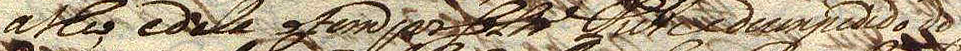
alheo, e dela o tem por soltr.o livre e dezinpedido do
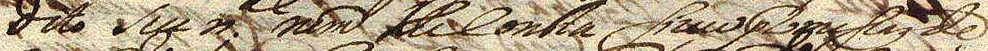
dito seu n;al nem lhe consta fizeçe promessaz de
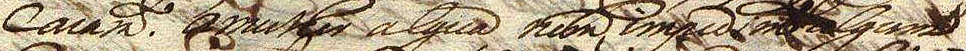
cazam.to a mulher algua, nem impedimto algum
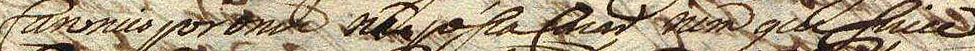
Canonico por onde não possa Cazar nem que fizeçe
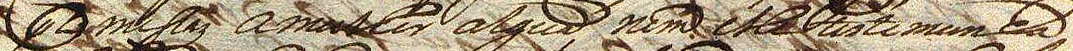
promessas a mulher algūa, nem elle testemunha
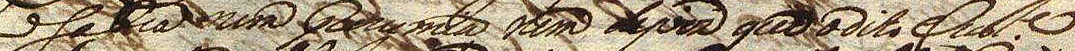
o sabia nem prezumia nem depoiz que o dito Iust.e
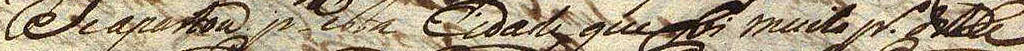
Se apartou p.a esta Cidade que foi muito pr.o delle
